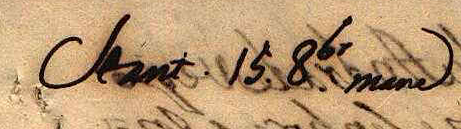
Stant. 15. 8.br mane
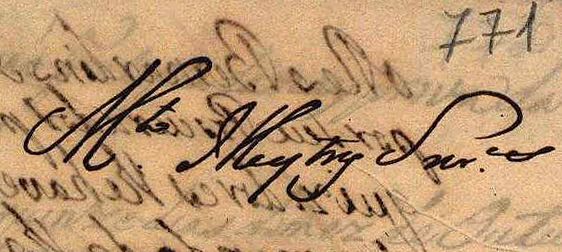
M.to Illustres Snr.es
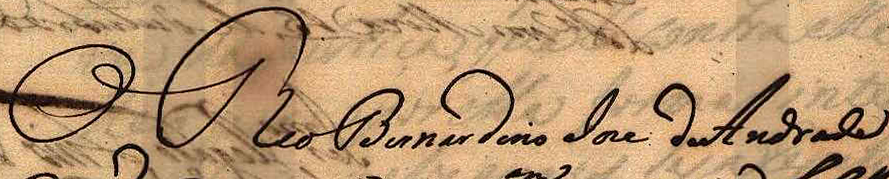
O Reo Bernardino Ioze de Andrade
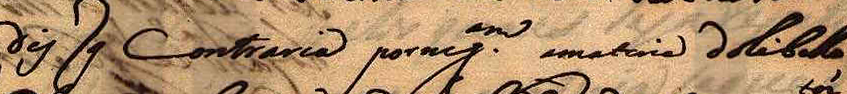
dis q̄ Contraria por neg.am a materia do libello,
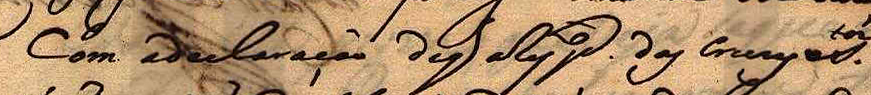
Com a declaraçaõ de q̄ a Resp.to das cruzes a s.tn
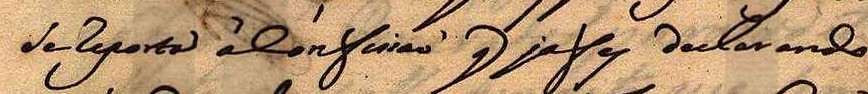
se Reporta á Confissaõ q̄ ja fes declarando
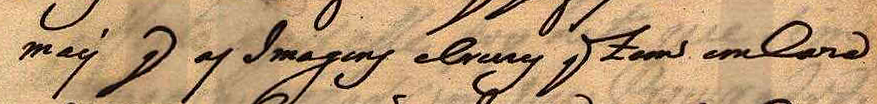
mais q̄ as Imagens e Creizes q̄ tem em Caza
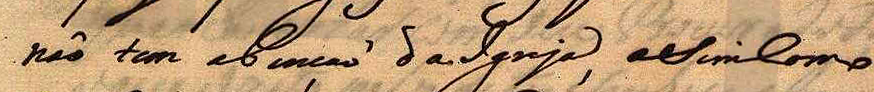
naõ tem a bençaõ da Igreja aSim Como
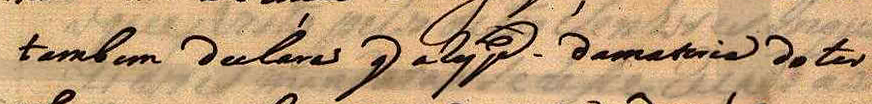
tambem declara q̄ a Resp.to da materia do ter
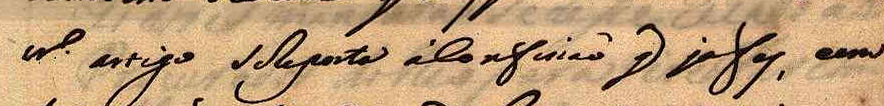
cr.o artigo se Reporta á Confissaõ q̄ ja fes, e em
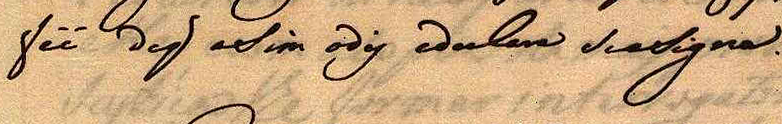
féé de q̄ asim o dis e declara se asigna.
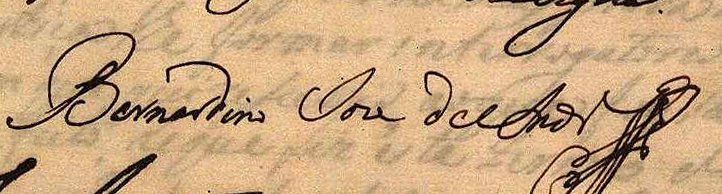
Bernardino Ioze de Andre
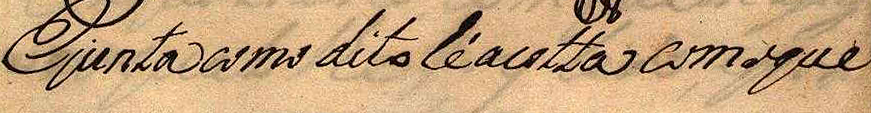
E junta como dito hé a cotta com o que
